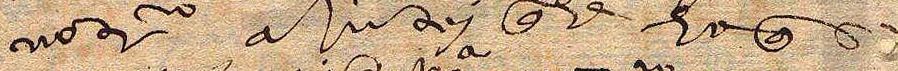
notrro aJūtej q̄ he ho q̄ se
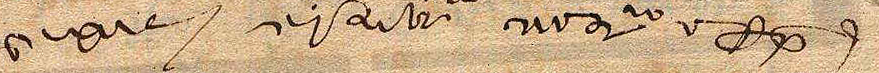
segue / ejtor vra notrro o stp̄
